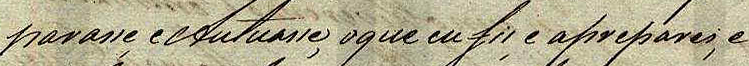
parasse e Autuasse, o que eu fis e a preparei, e
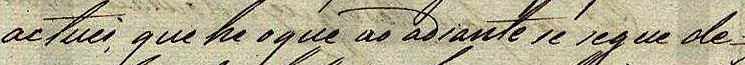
actuei, que he o que ao adiante se segue de
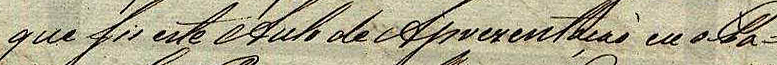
que fis este Auto de Aprezentaçaõ eu o Pa
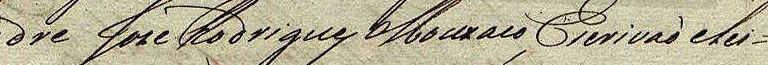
dre Joze Rodrigues Mouzais, Escrivaõ elei
